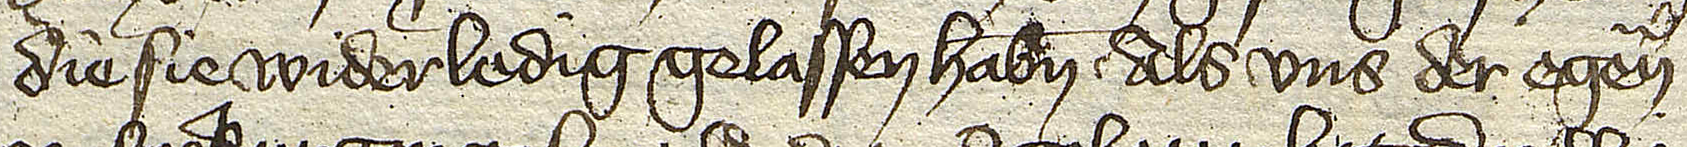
die ſie wider ledig gelaſſen habn* / Als vns der egen*
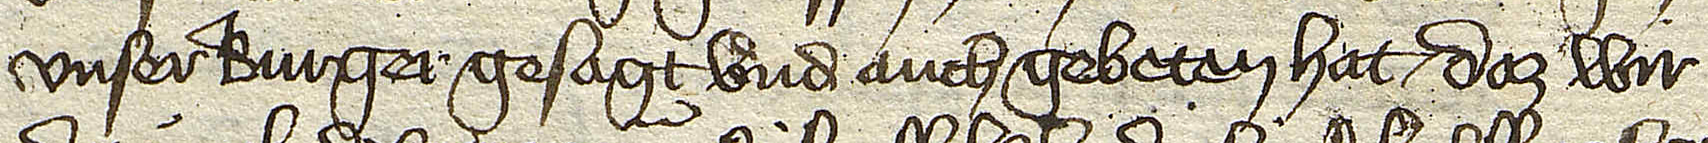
vnſer Burger geſagt vnd auch gebeten hat / daʒ wir
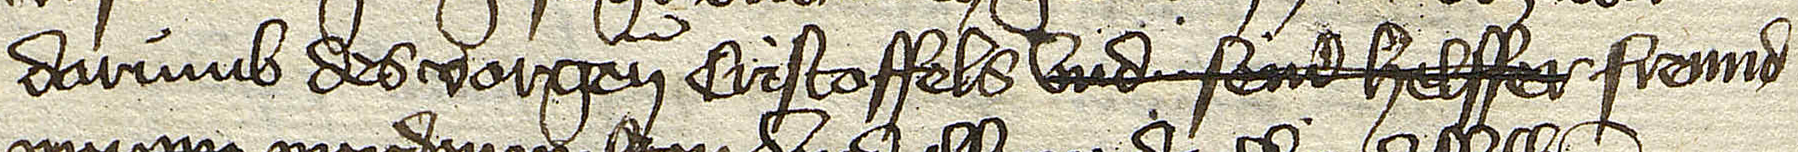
darümb des vorgen* Criſtoffels vnd ~ ſein* helffer freund
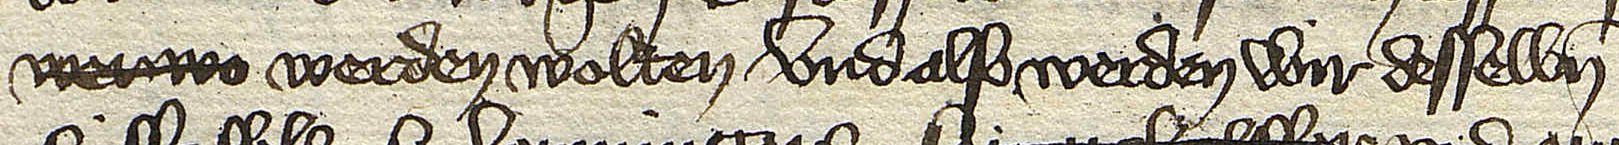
wer wo werden wolten / Vnd alſo werden wir deſſelbn*
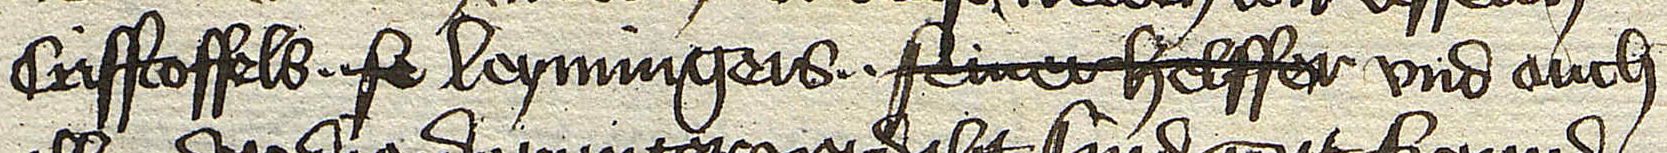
Criſtoffels ~ ſe leymingers ~ ſeiner helffer vnd auch
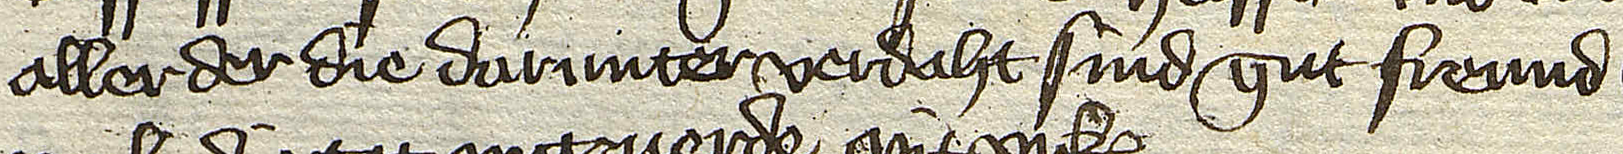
aller der die darunter verdaht ſind gut freund
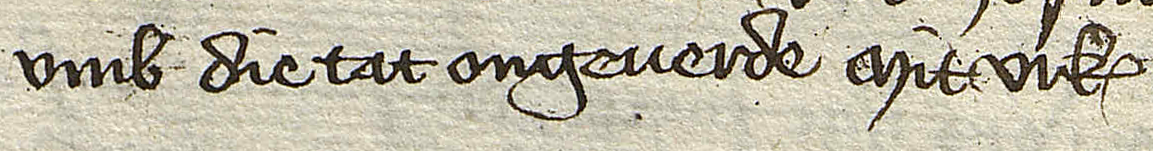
vmb die tat ongeuerde Mit vrk*
